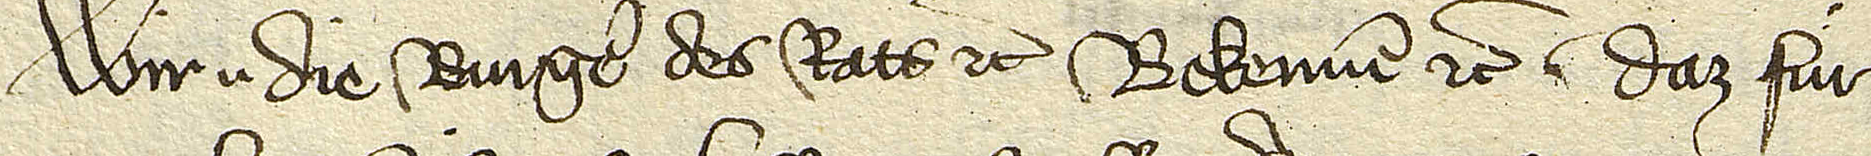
Wir ~ die Burge* des Rats ec* Bekenne* ec* / daʒ für
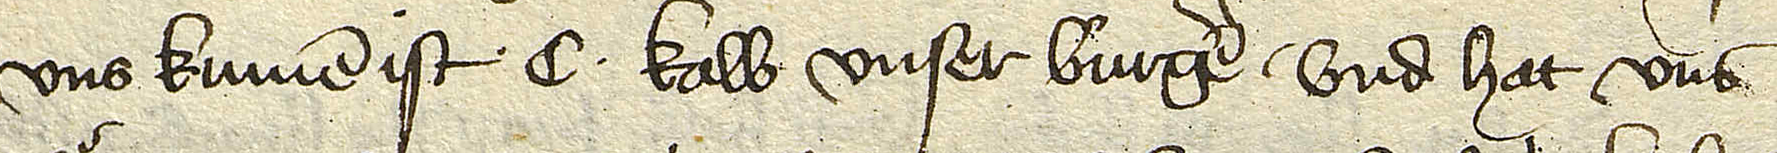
vns kume* iſt . C . Kalb vnſer burge* / vnd hat vns
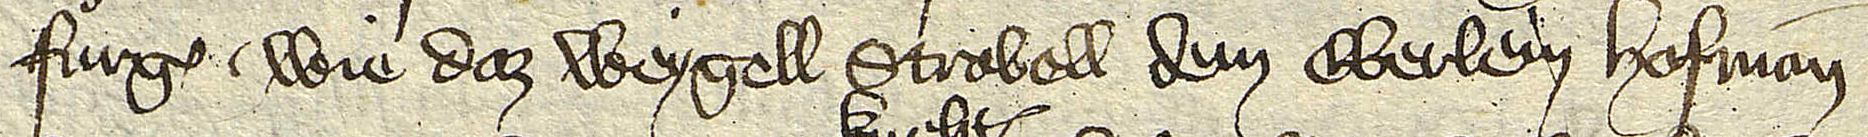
fürg* / wie daʒ Weygell Strobell dem Eberlein Hofman*
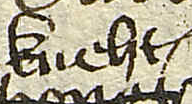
knecht
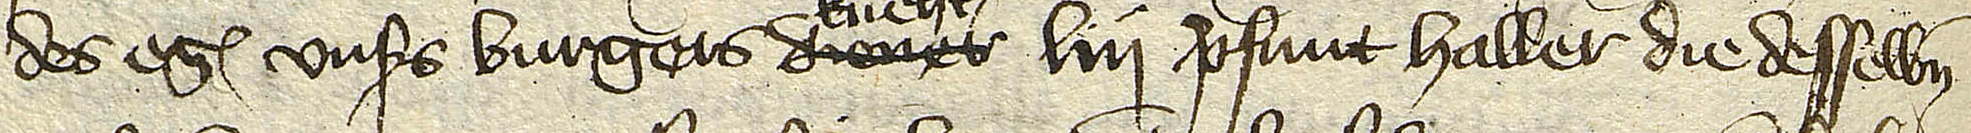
des eg* vnſ*s burgers diener liii pfunt haller die deſſelbn*
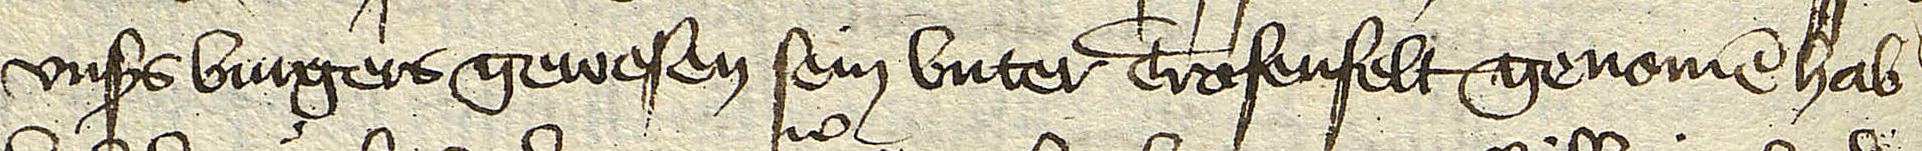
vnſ*s burgers geweſen ſein vnter Trofenfelt genome* hab
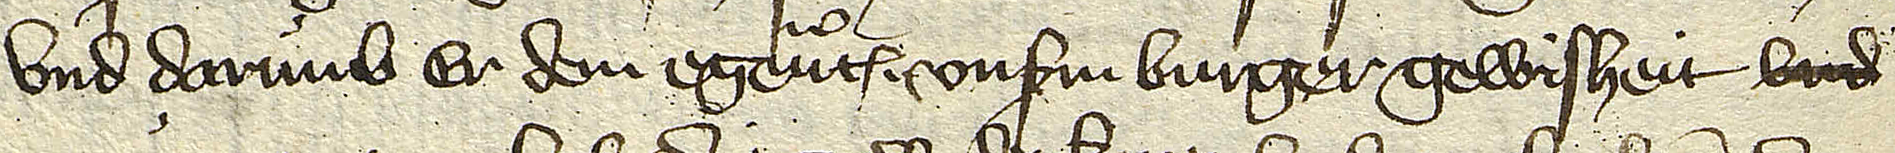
vnd darümb Er dem egent* . vnſ*m burger gewiſheit vnd
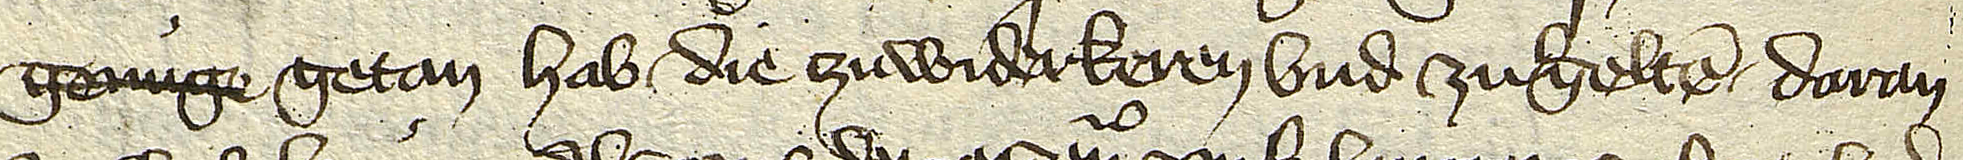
genüge getan hab / die cʒu widerkeren vnd cʒugelte* / daran
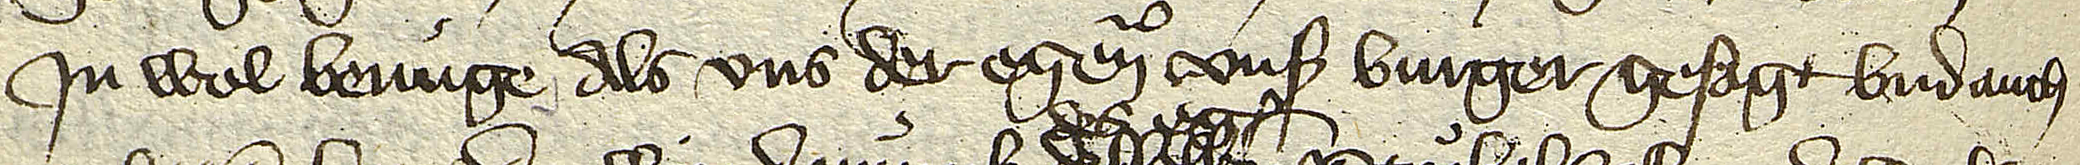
In wol benüge Als vns der egen* vnſ* burger geſagt vnd auch
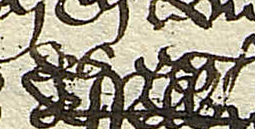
des eg*
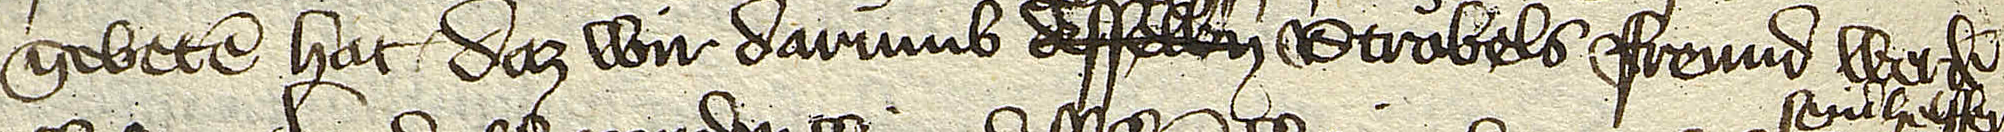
gebete* hat / daʒ wir darümb deſſelbn* Ströbels freund werde*
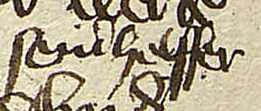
ſein helffer
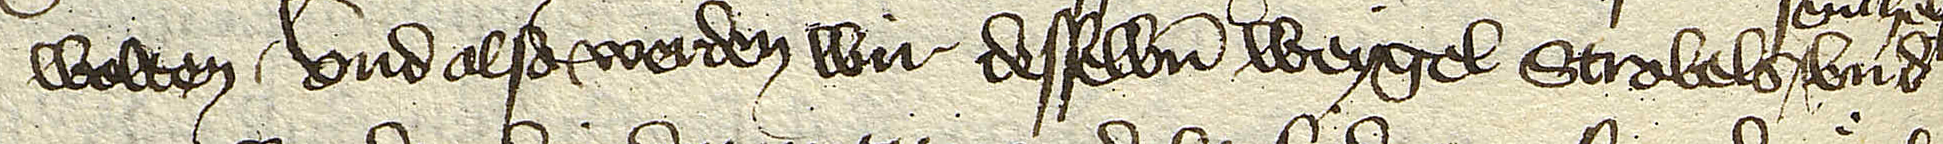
wolten / vnd alſo werden wir deſſelbn* weygel Strobels vnd
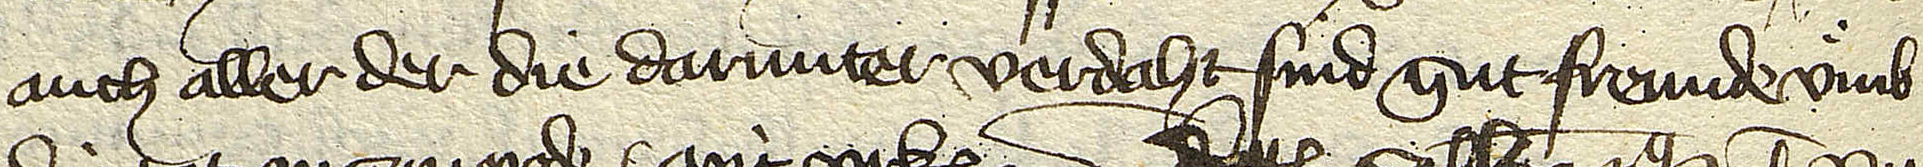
auch aller der die darunter verdaht ſind gut freunde v̈mb
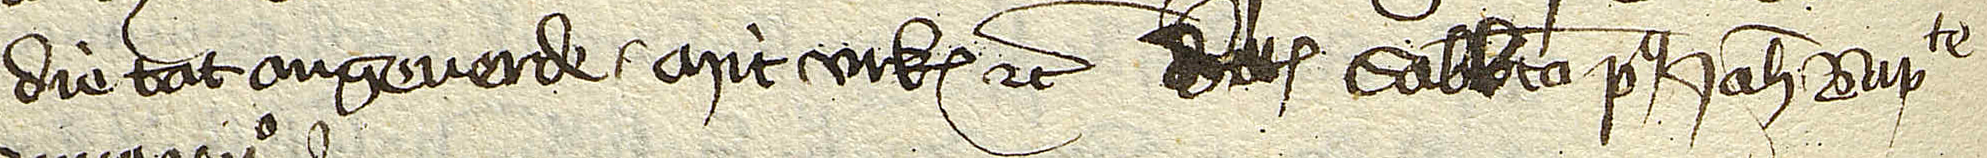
die tat ongeuerde / Mit vrk* ec* Dat* Sabbto* p* Ioh* Bap*
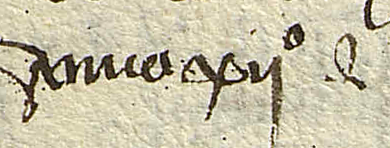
Anno xii* §
